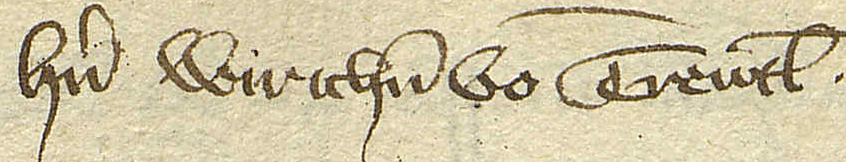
hn* wirichn* vo* Trewtl*
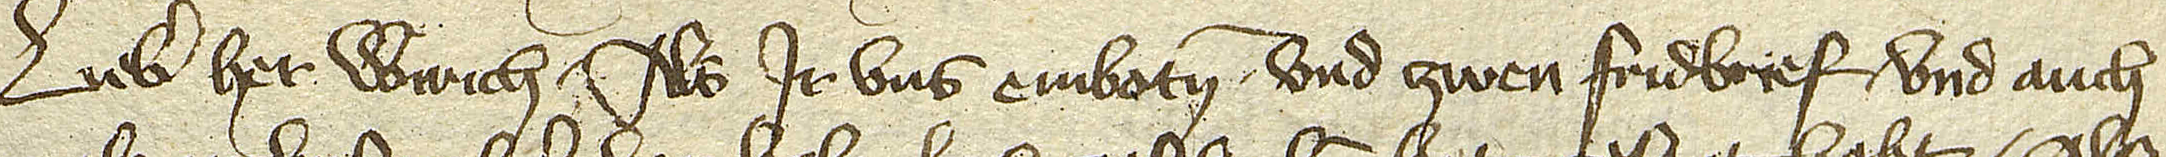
Lieb* her Wirich / Als Ir vns embotn* / vnd cʒwen fridbrief / vnd auch
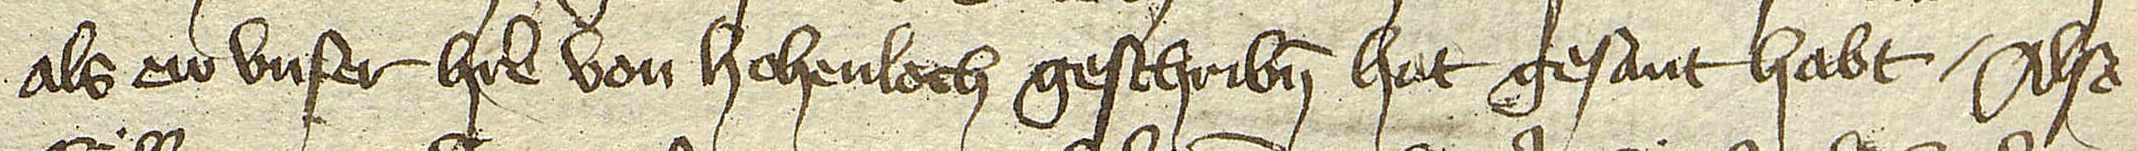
als ew vnſer hr*e von hohenloch geſchribn* hat geſant habt / Alſo
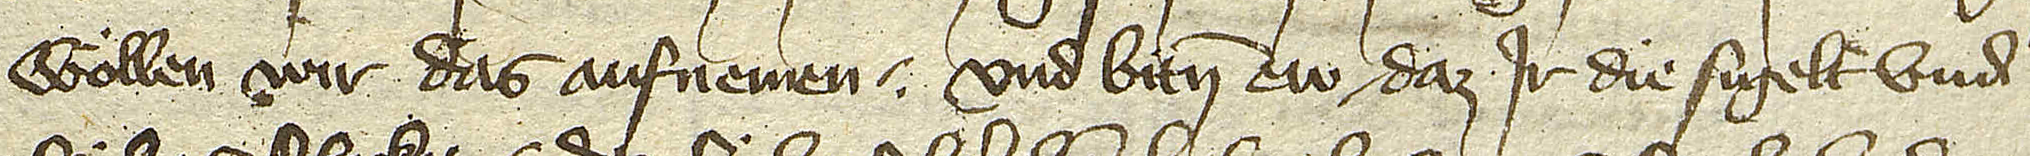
wöllen wir das aufnemen / . vnd bitn* ew / daʒ Ir die ſigelt vnd
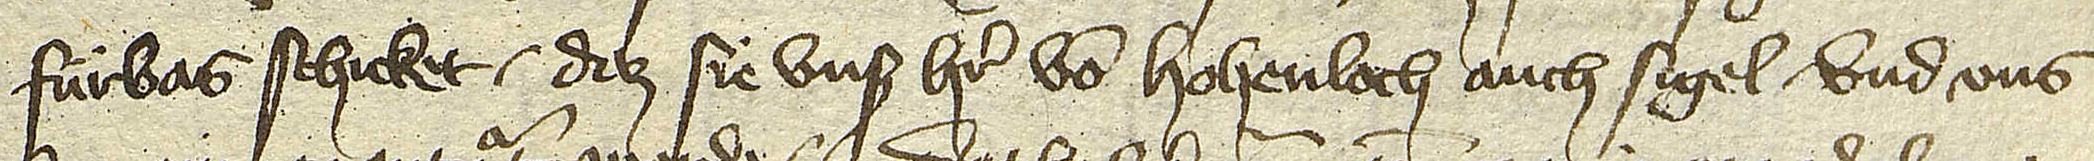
fürbas ſchicket / daʒ ſie vnſ* hr* vo* hohenloch auch ſigel / vnd vns
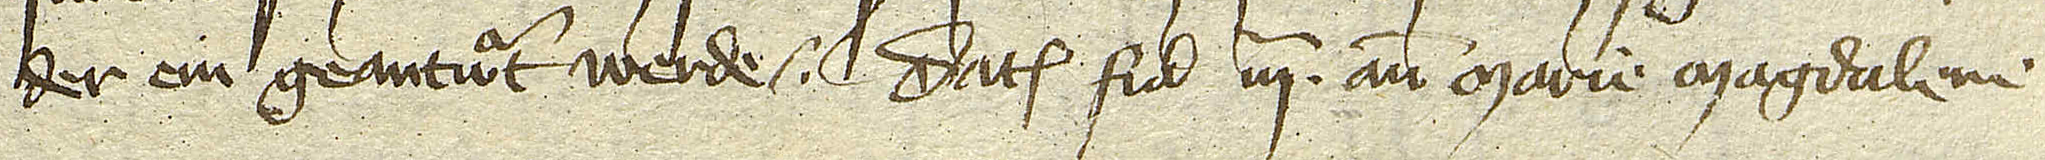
der ein geantwt* werde / . Dat* fia* iii* . an* Marie Magdalene
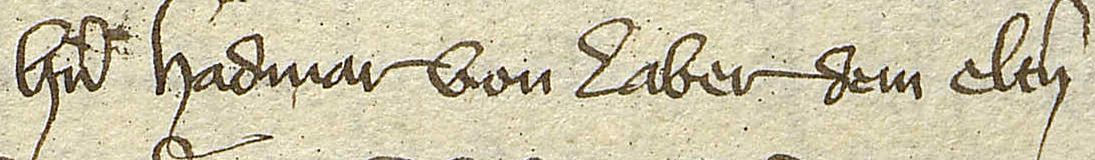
hn* hadmar von Laber dem eltn*
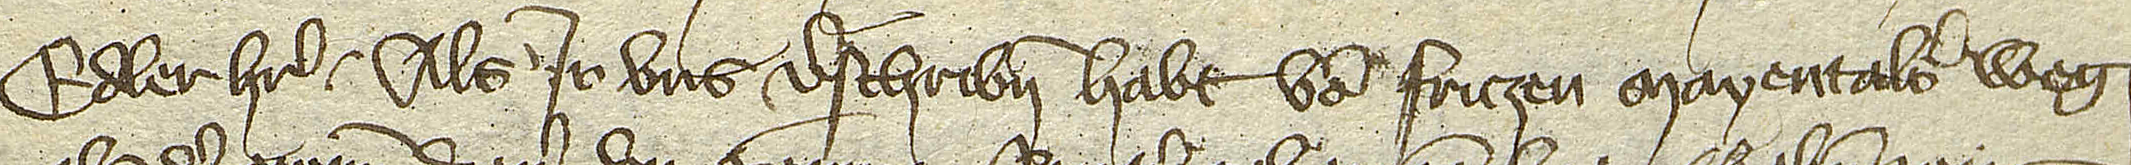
Edler hr* / Als Ir vns v*ſchribn* habt vo* fricʒen Mayentals* weg*
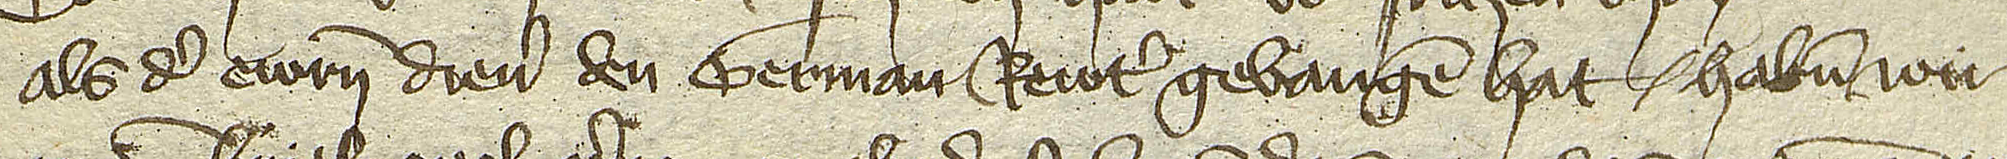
als d* ewrn* dien* den German Rewt* gevange* hat / habn* wir
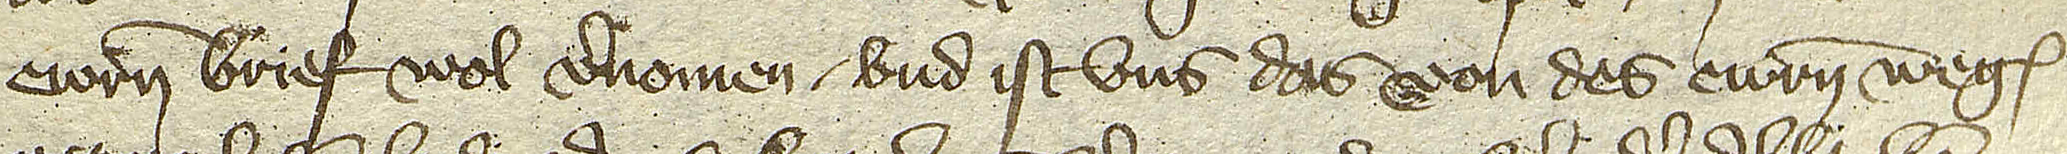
ewrn* brief wol v*nomen / vnd iſt vns das von des ewrn* weg*
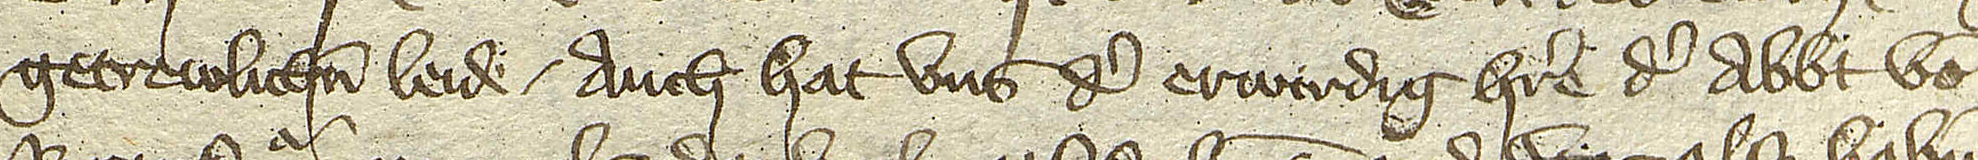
getrewlichn* leide / Auch hat vns d* erwirdig hr*e d* Abbt vo*
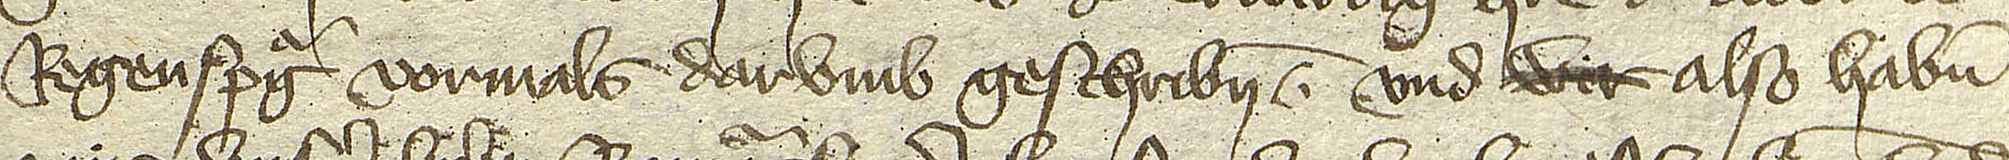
Regenſp*g vormals darvmb geſchribn* / . vnd wir alſo habn*
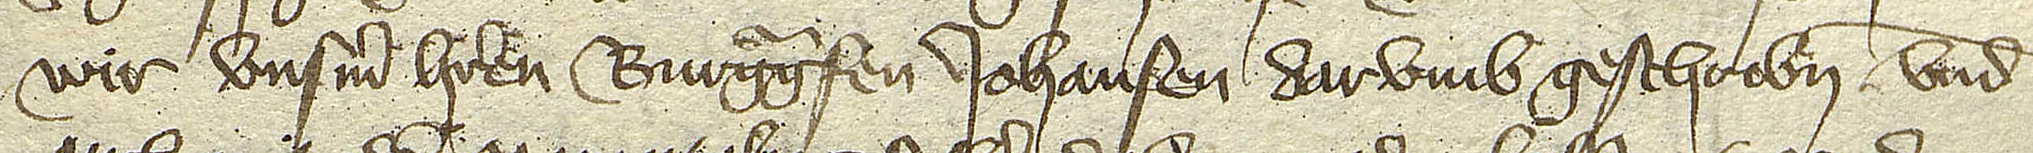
wir vnſm* hr*en Burgg*fen Iohanſen darvmb geſchribn* / vnd
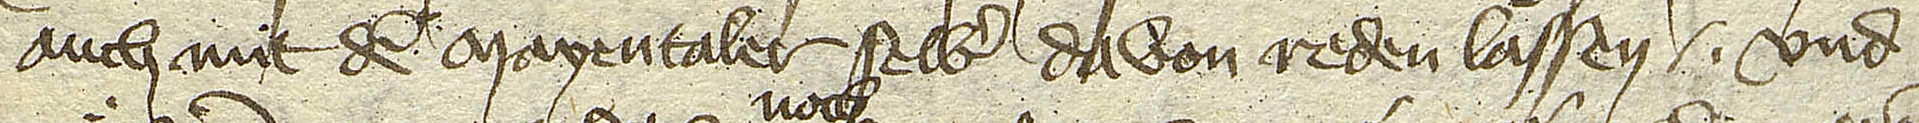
auch mit d* Mayentaler ſelb* davon reden laſſen / . vnd
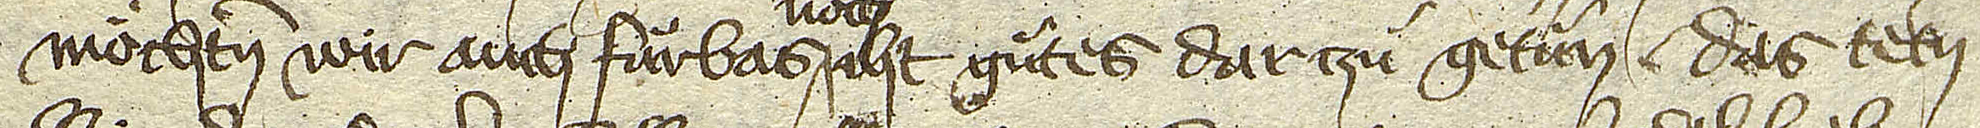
möchtn* wir auch fürbas iht gütes darcʒu getün / das tetn*
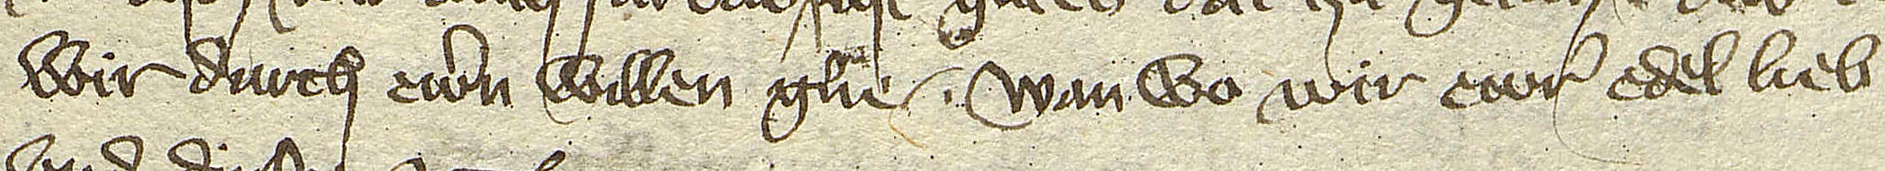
wir durch ew*n willen g*ne / . wan wo wir ewr* edel lieb
